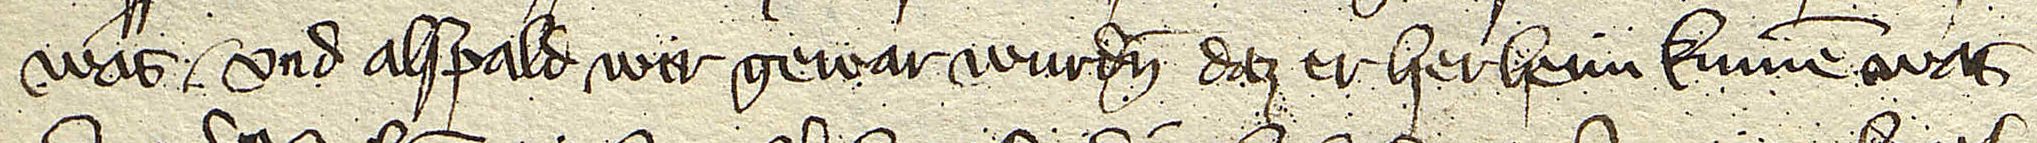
was / vnd alſpald wir gewar wurdn* daʒ er herheim kume* was
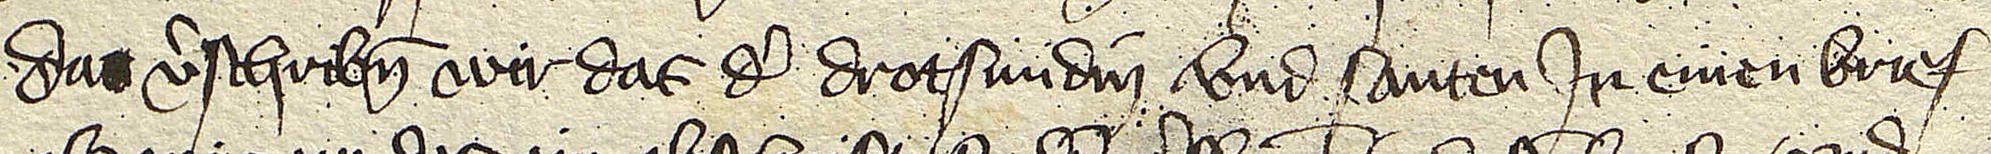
Das v*ſchribn* wir das d* drotſmidin / vnd ſanten In einen brief
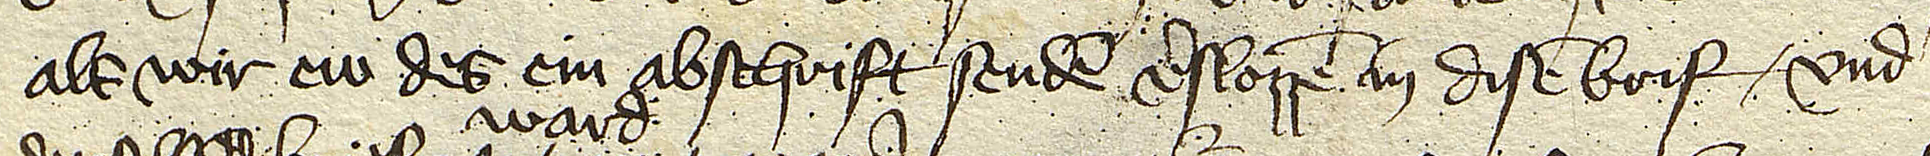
als wir ew des ein abſchrift ſende* v*ſloʒʒe* in diſe* brif / vnd
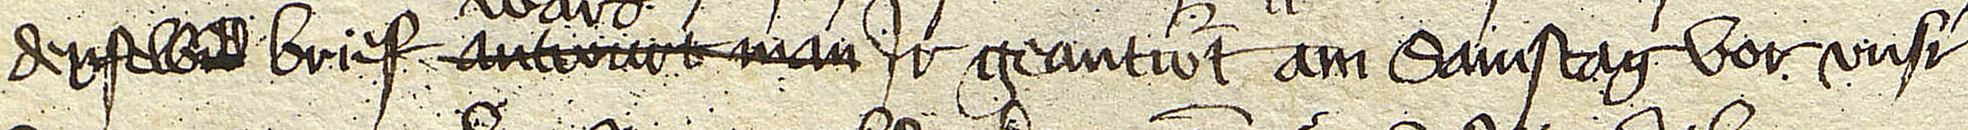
derſelbn* brief antwurt man Ir geantw*t am Samſtag vor vnſr*
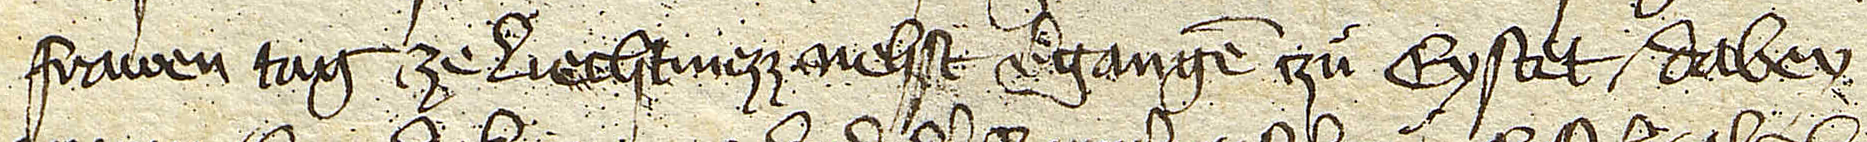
frawen tag cʒe Liechtmeʒʒ nehſt v*gange* cʒü Eyſtet / dabey
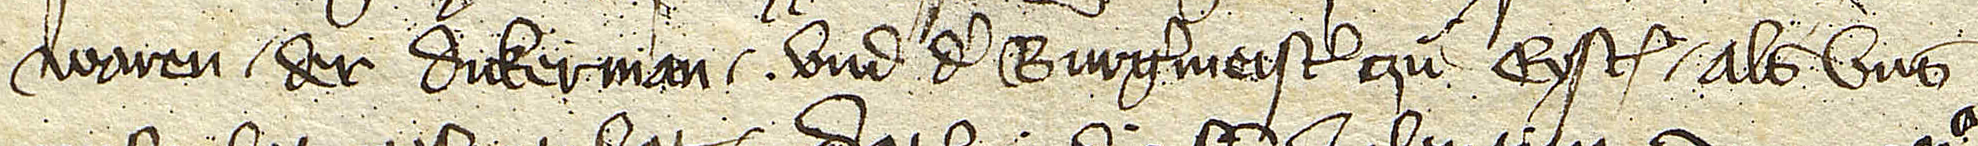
waren / der dickerman / . vnd d* Burg*meiſt* cʒü Eyſt* / als vns
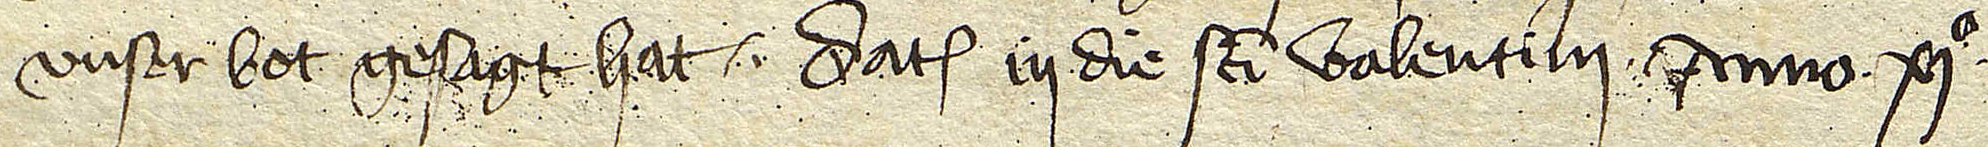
vnſer bot geſagt hat / . Dat* in die ſci* Valentini / Anno xi*
